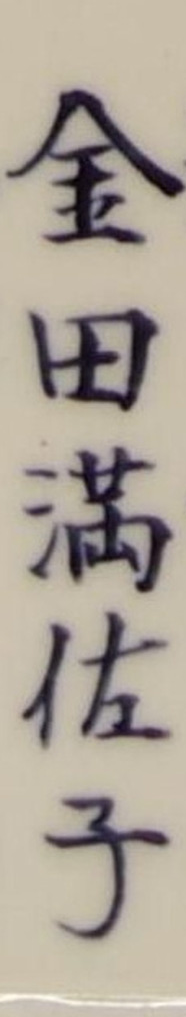金田満佐子
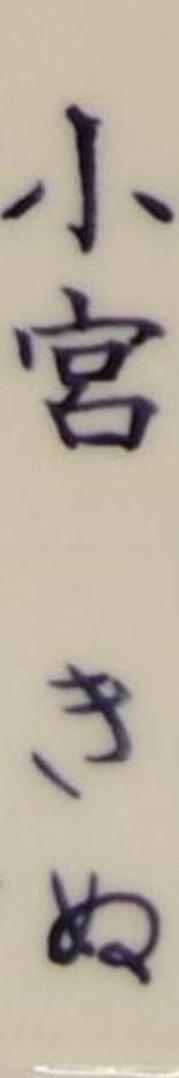小宮きぬ
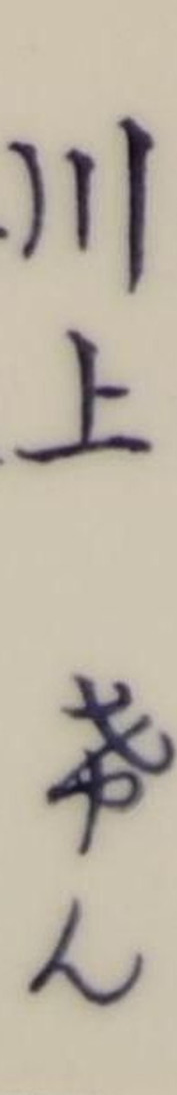川上けん
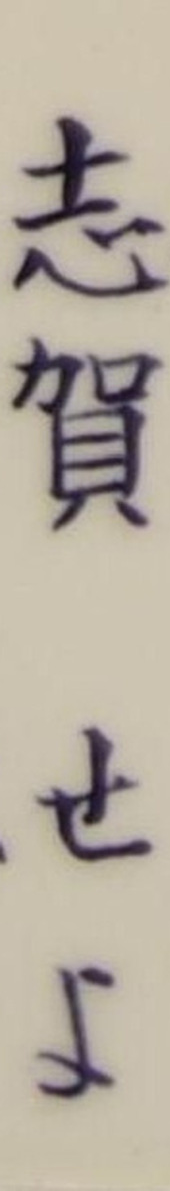志賀せよ
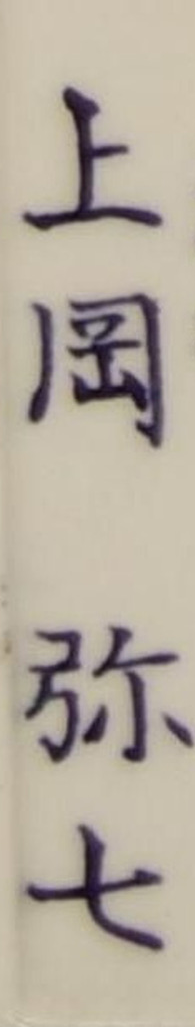上岡弥七

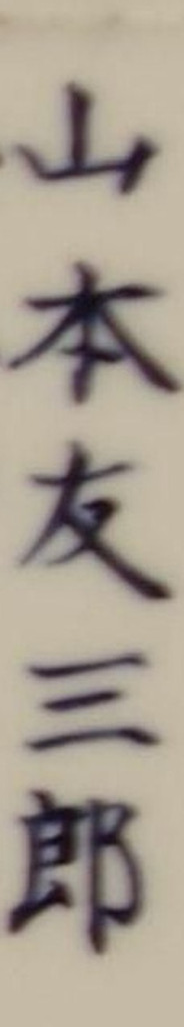山本友三郎
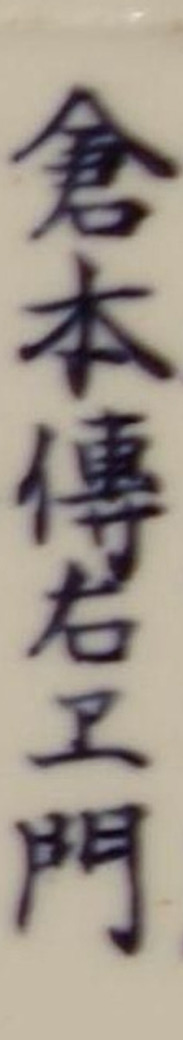倉本傳右ヱ門
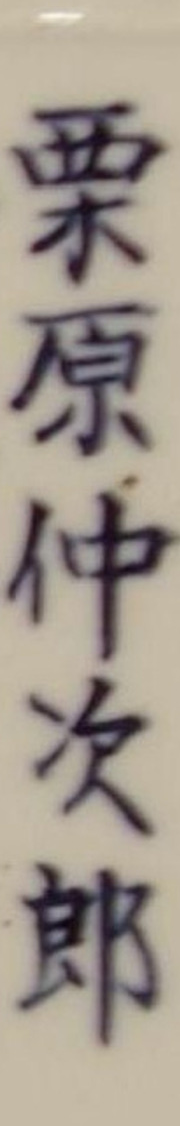栗原仲次郎
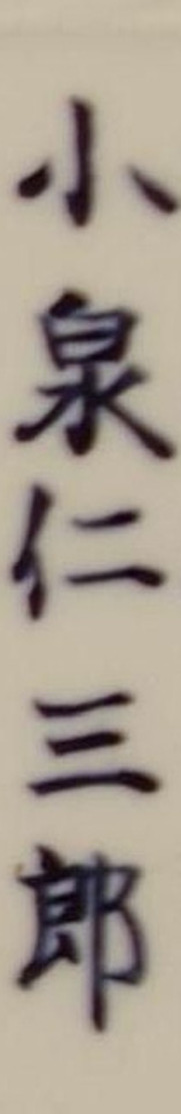小泉仁三郎
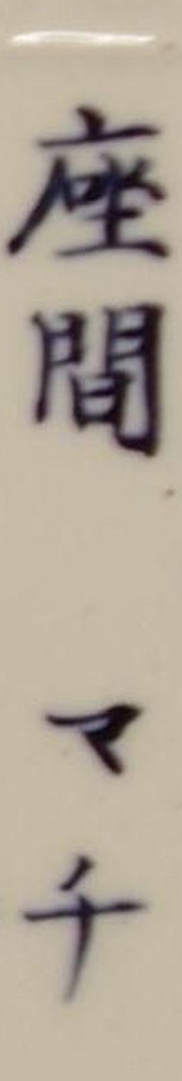座間マチ
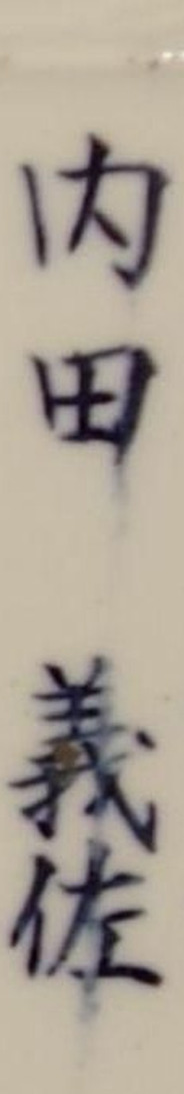内田義佐
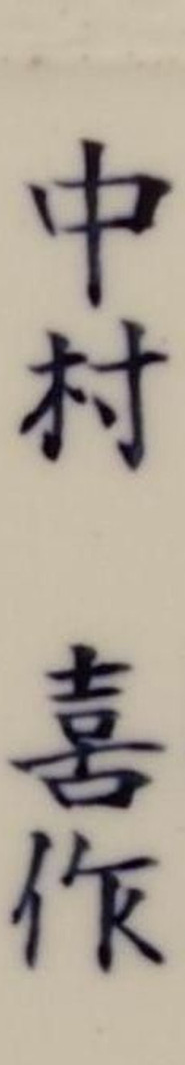中村喜作
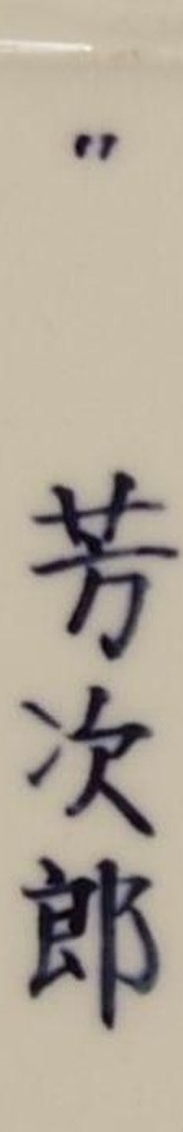芳次郎
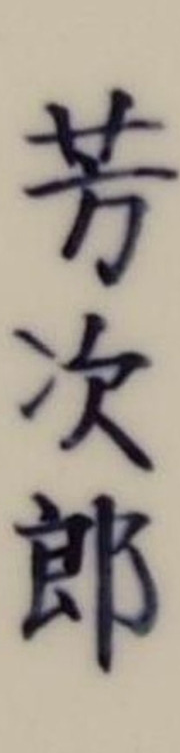芳次郎
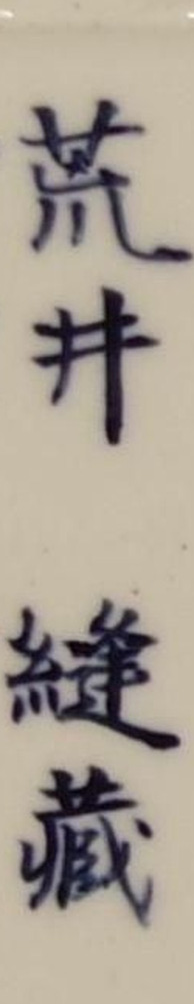荒井縫蔵
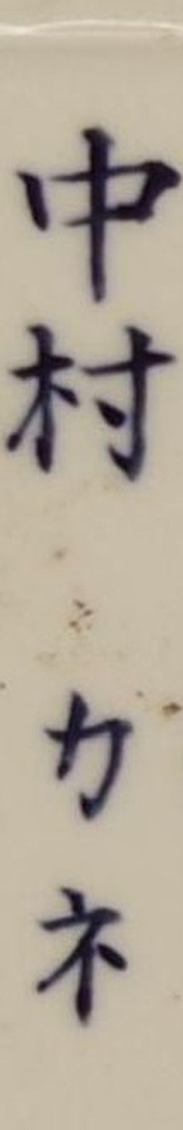中村カネ
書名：M~S
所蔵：高野山金剛峯寺
